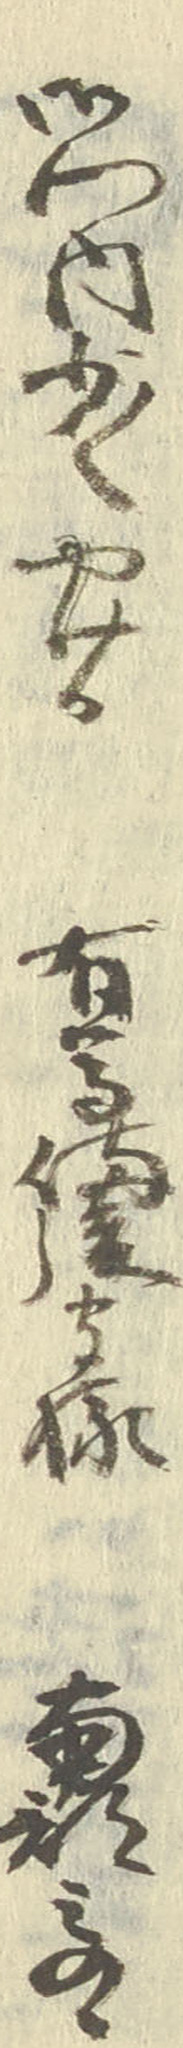御門内少〳〵やける有馬備後守様南部ミのゝ
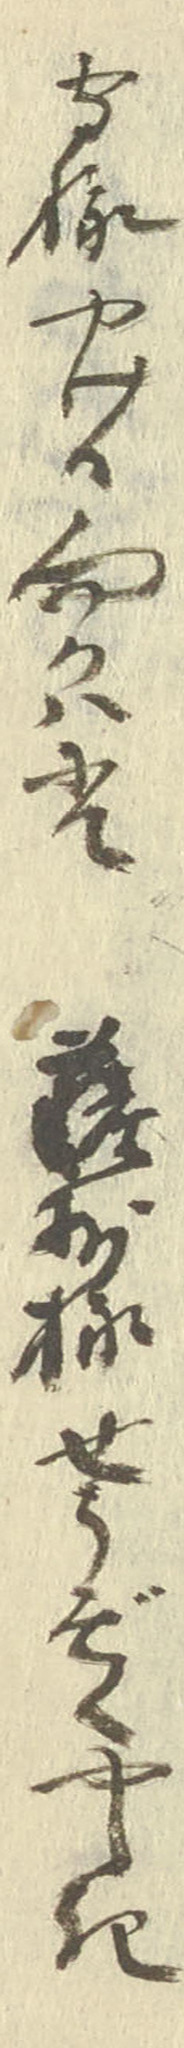守様やける向かハにて薩州様せうぞくやき
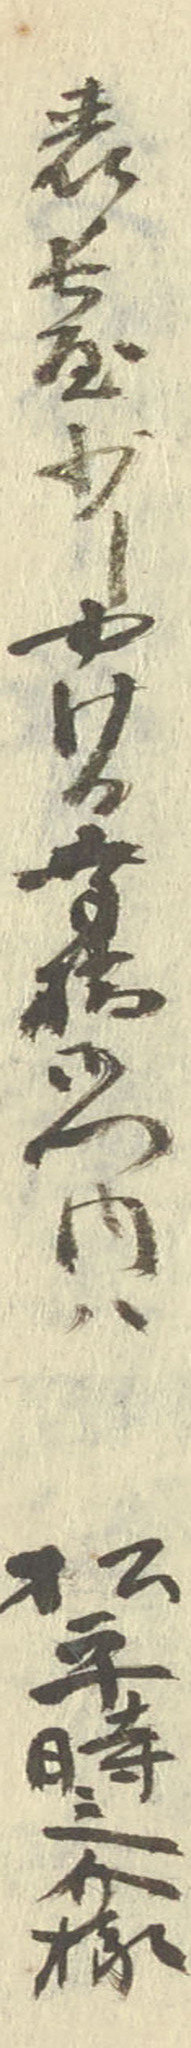表長屋少しやける幸橋御門内ハ松平時之介様
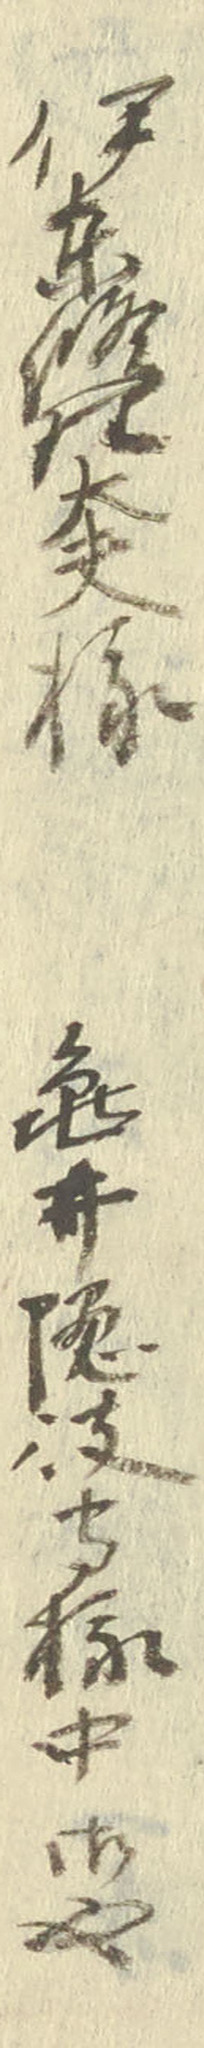伊藤修理大夫様亀井隠岐守様中御や
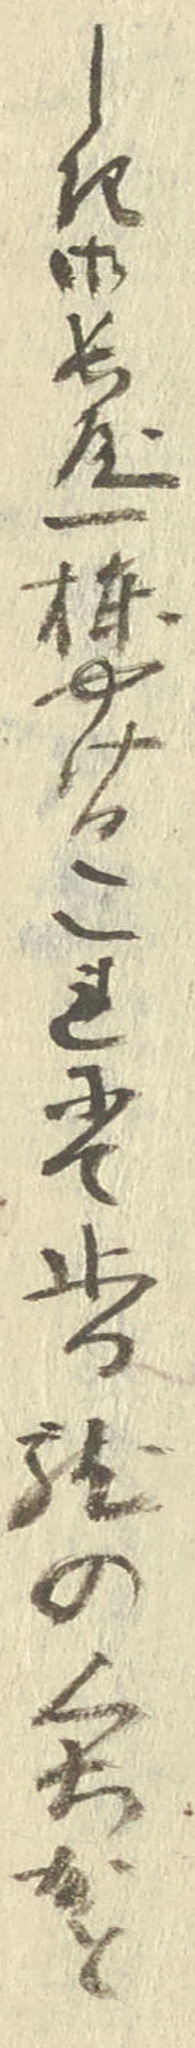しき御長屋一棟やけるこれにて止る龍のくちかと
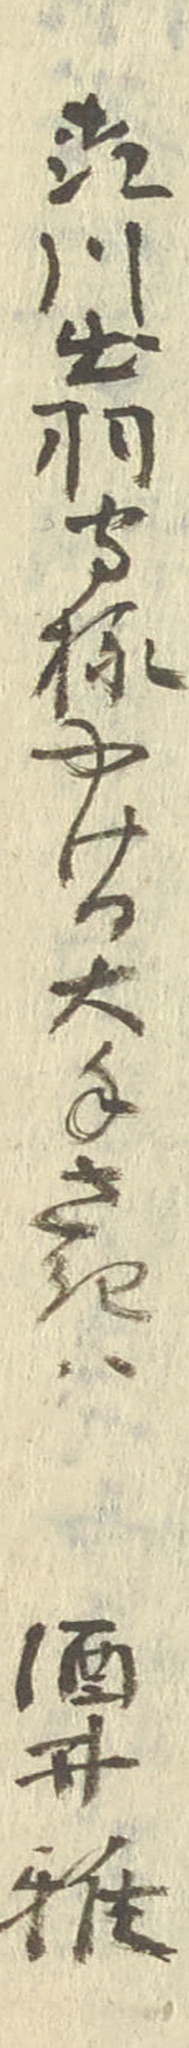森川出羽守様やける大手さきハ酒井雅
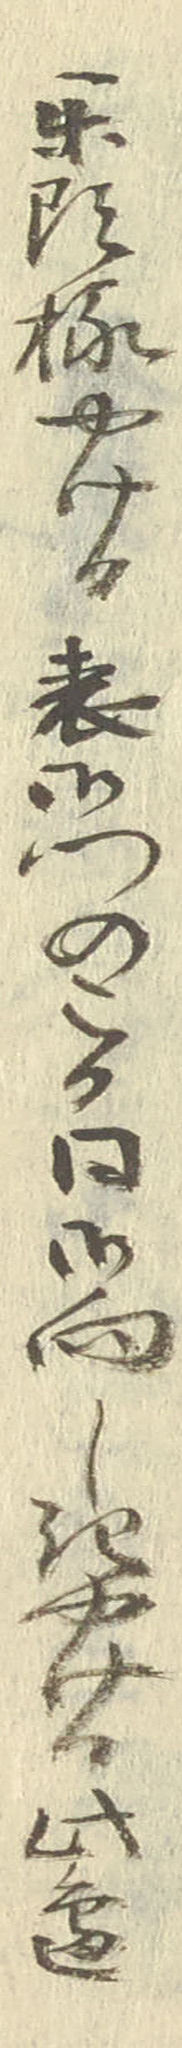楽頭様やける表御門のこる同御向しきやける此邊
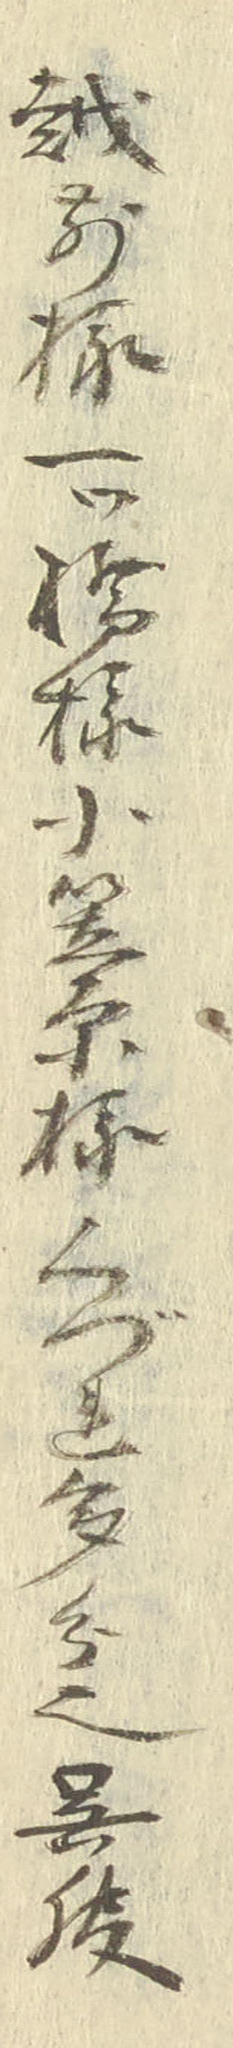越前様一ツ橋様小笠原様くづれ多分也呉服
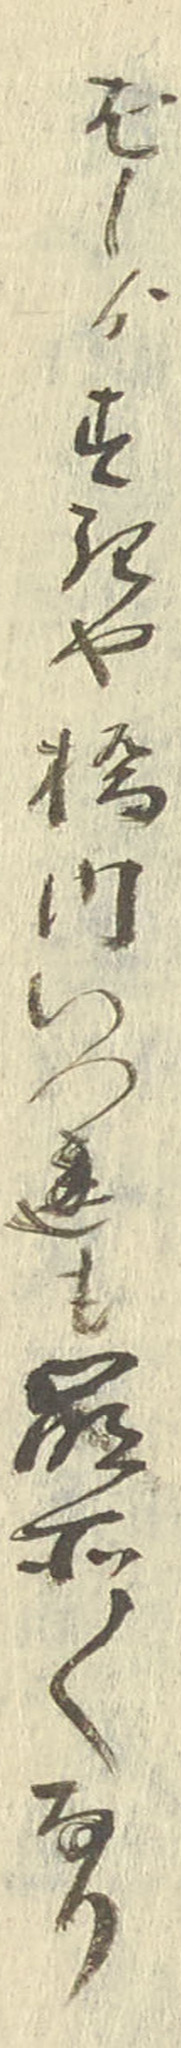ばしゟすきや橋内いつれも崩所〳〵なり
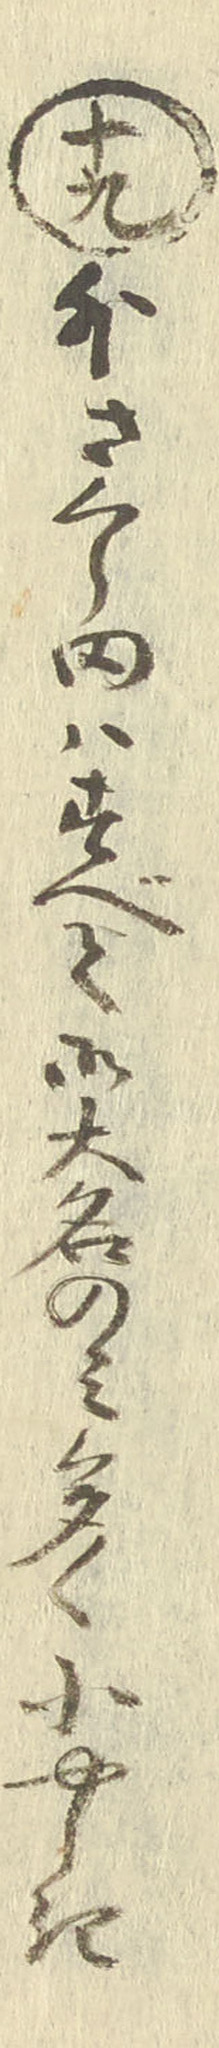十九外さくら田ハすべて御大名のミ多く小やき
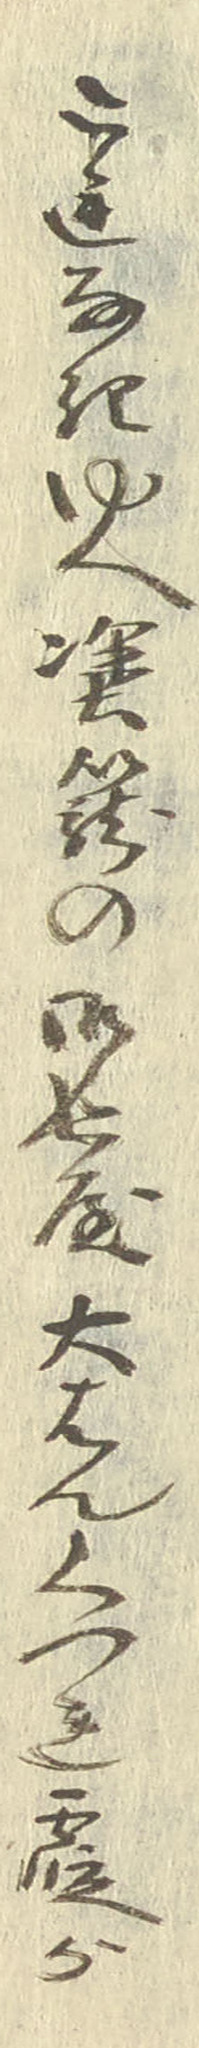これなきゆへ塗籠の御長屋大はんくつれ霞が
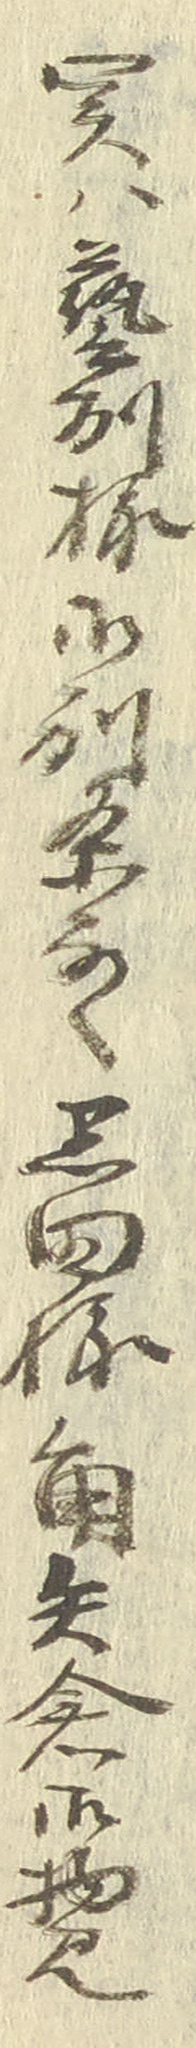関ハ藝州様御別条なく黒田様角矢倉御物見
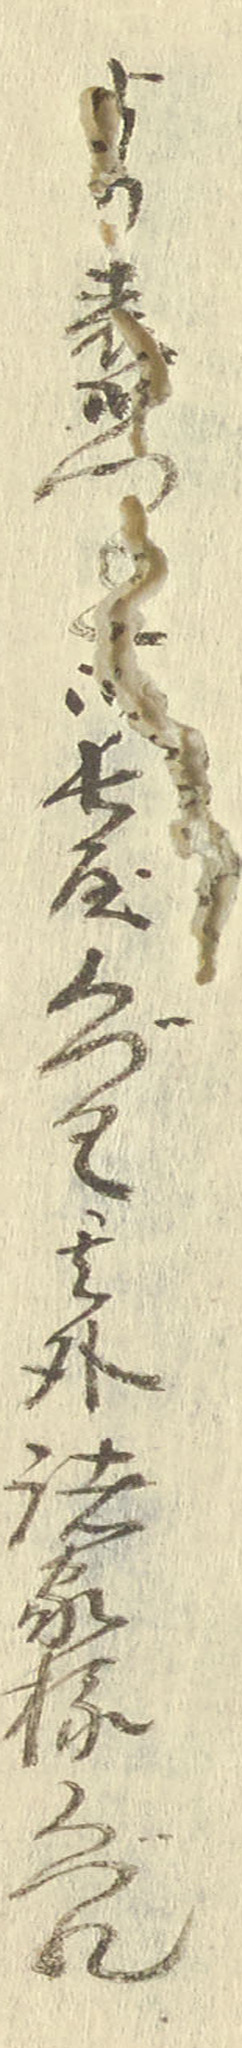より表御門迄御長屋くづるゝ其外諸家様くづれ
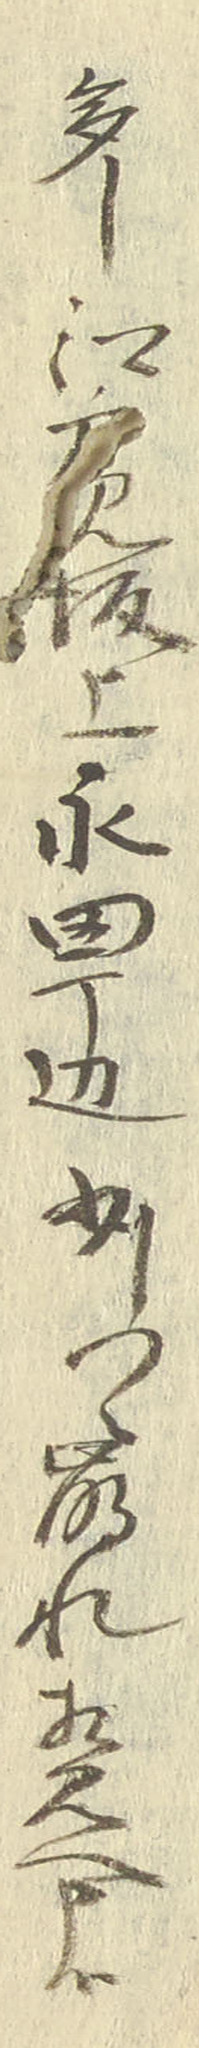多し江戸見坂上永田丁辺少しつゝ崩れ相見へ申候
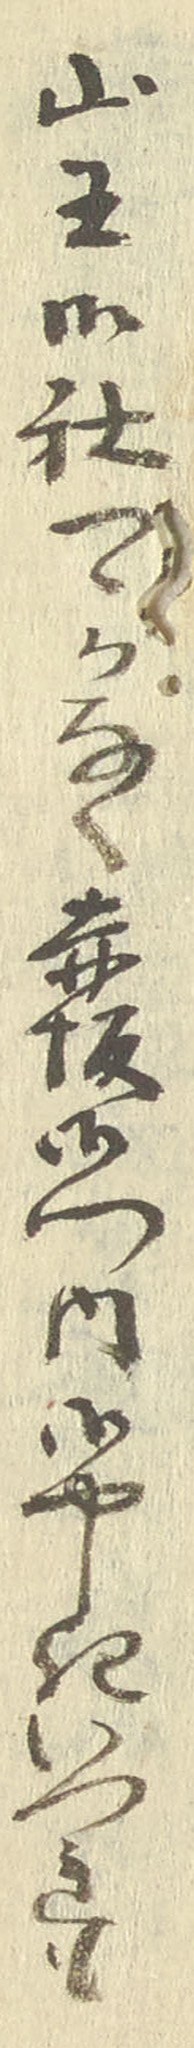山王御社つゝかなく赤坂御門内御やきいつれも
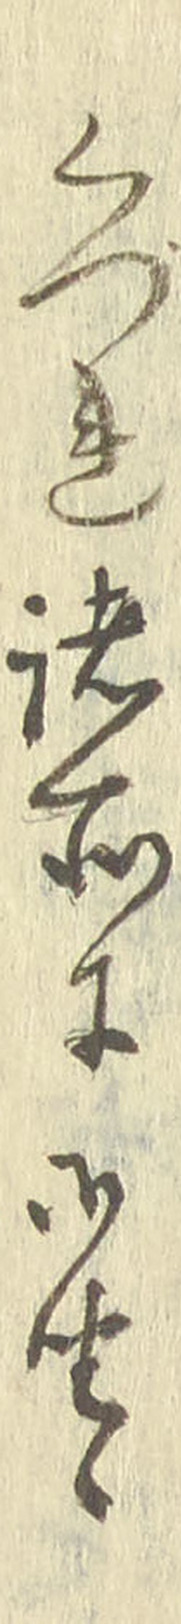くづれ諸所に御坐候
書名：御府内御屋敷方市中共地震類焼場所明細書之冩兼街道筋近郷聞書
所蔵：東京大学総合図書館 General Library in the University of Tokyo, JAPAN
